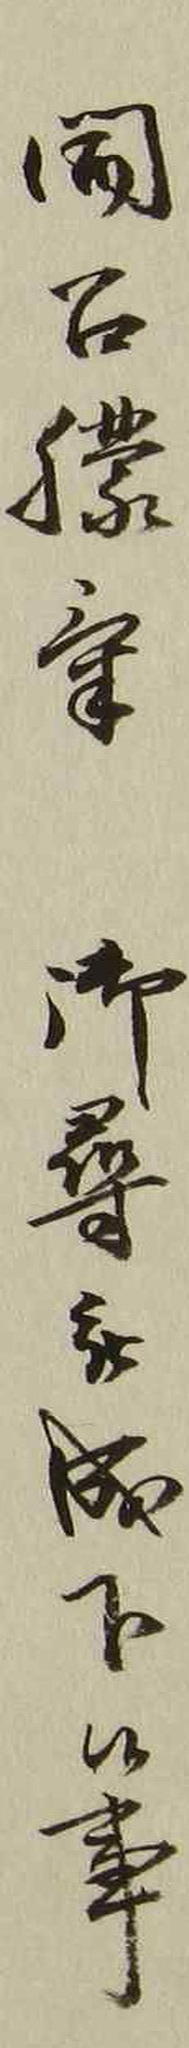聞召朦気御尋被成下候事
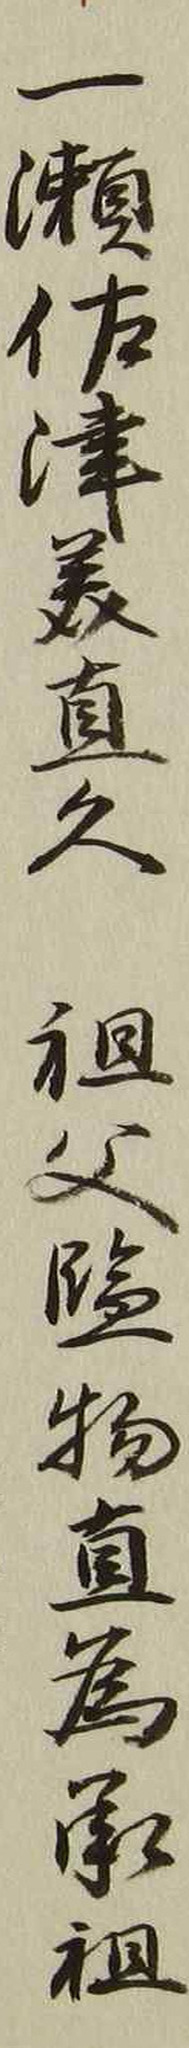一瀬佐津美直久祖父監物直為承祖
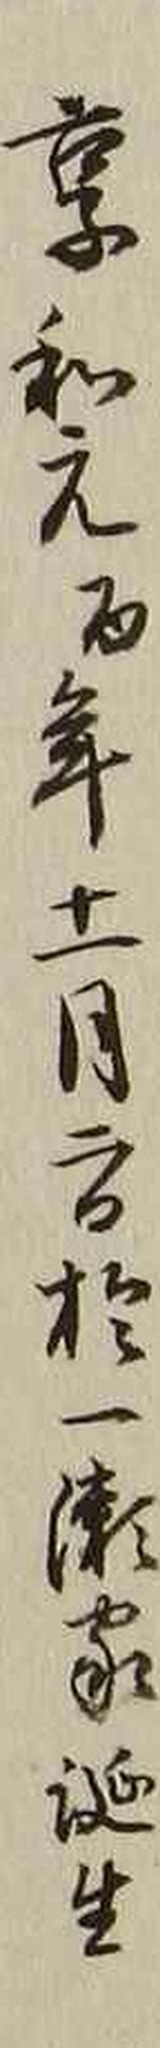享和元酉年十一月二日於一瀬家誕生
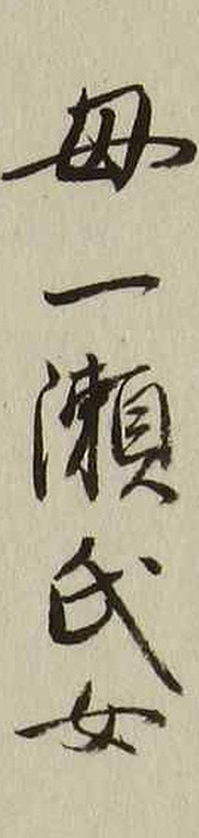母一瀬氏女
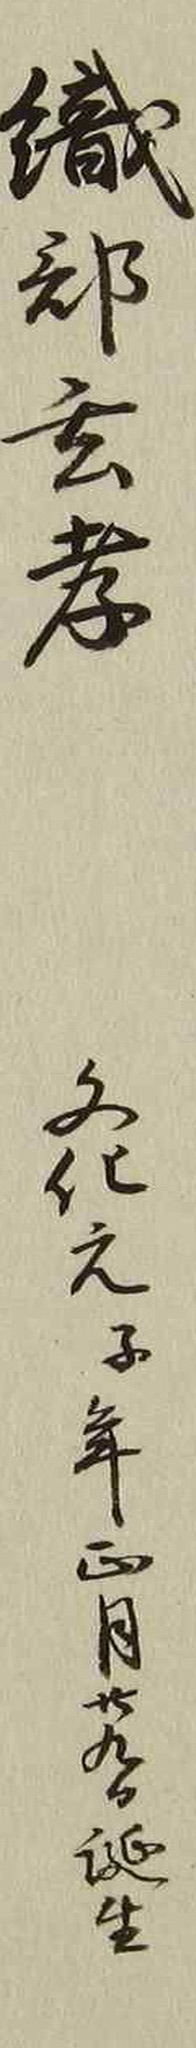織部玄孝文化元子年正月廿九日誕生
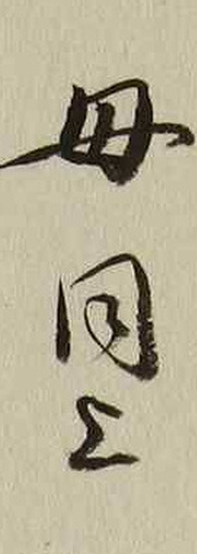母同上
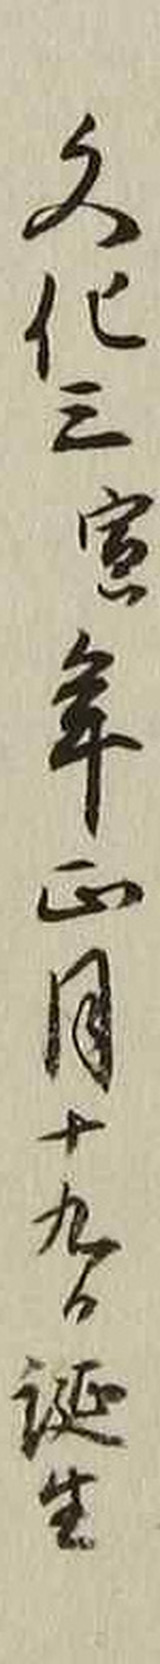女文化三寅年正月十九日誕生
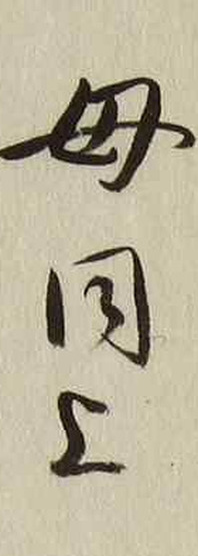母同上
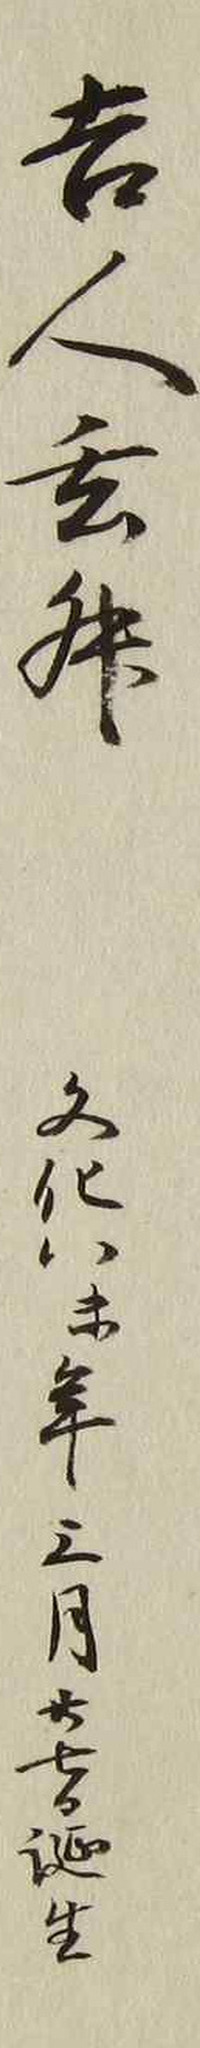吉人玄舞文化八未年三月廿七日誕生
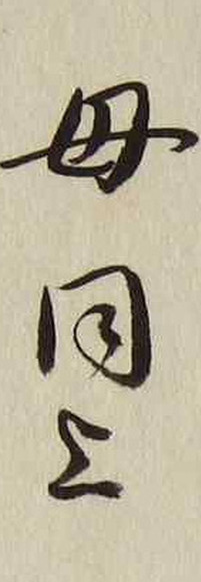母同上
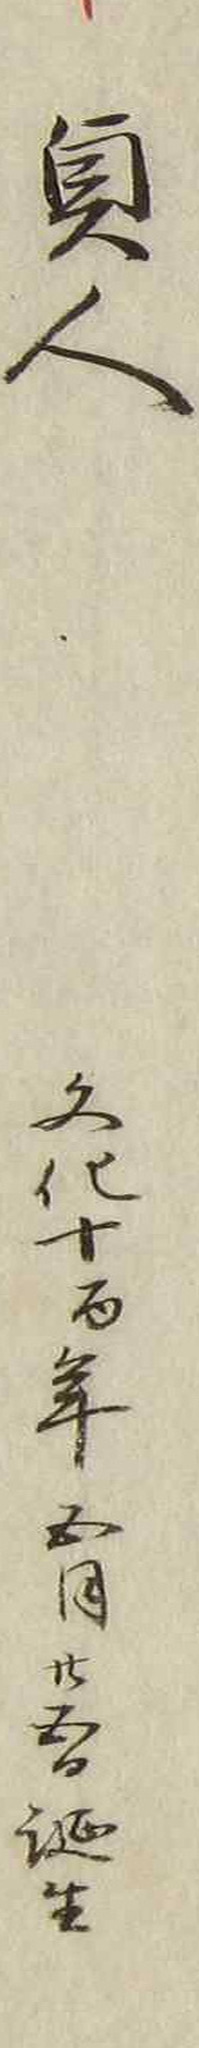貞人文化十酉年五月廿五日誕生
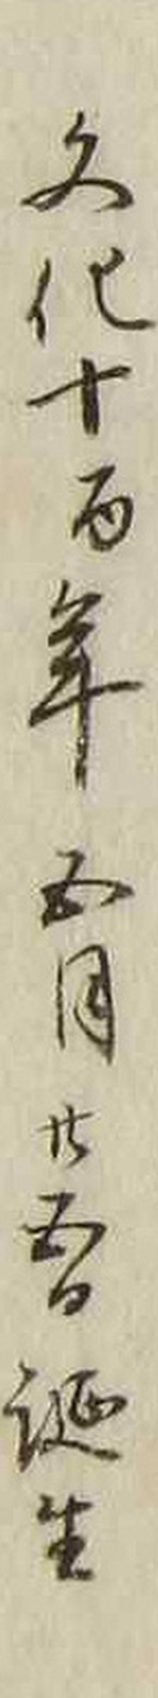貞人文化十酉年五月廿五日誕生

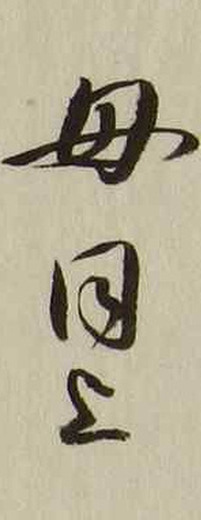母同上
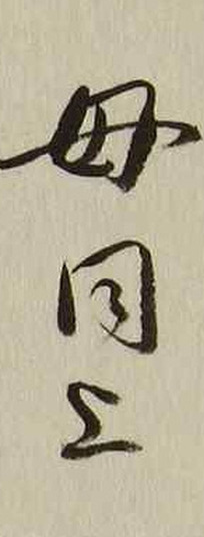母同上
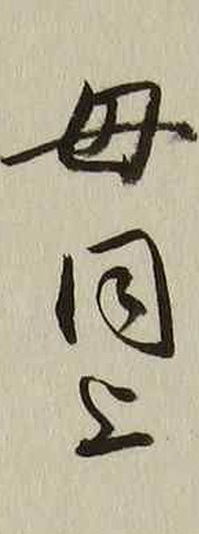母同上
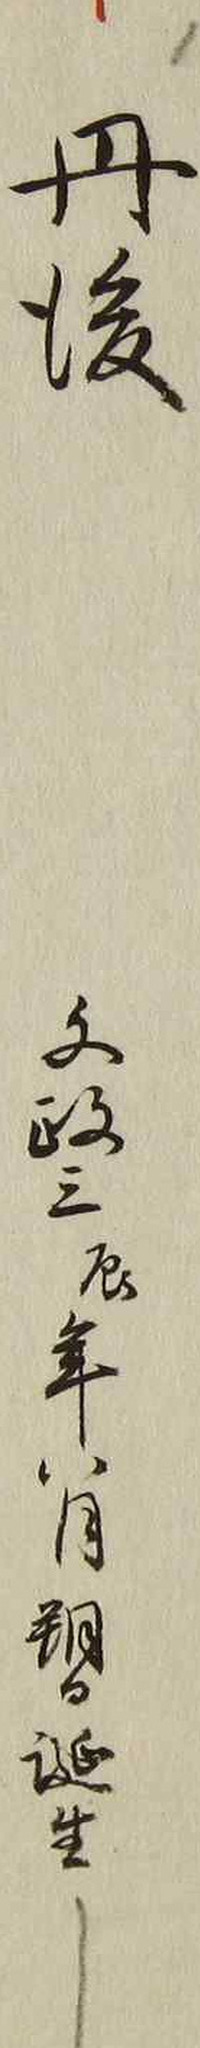丹後文政三辰年八月朔日誕生
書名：諸士系譜　巻之125　た之部1
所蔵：会津若松市立会津図書館
